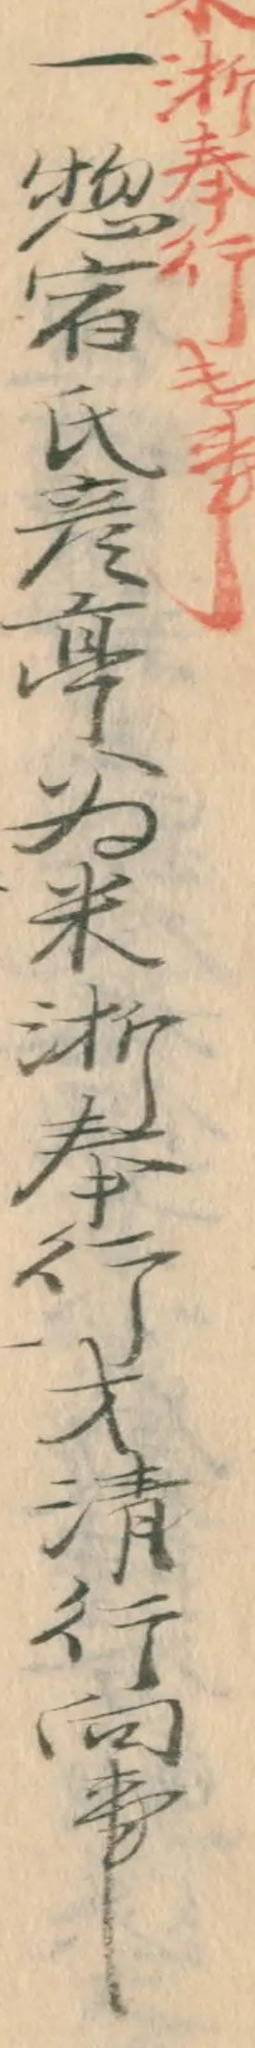一惣宿氏彦亭へ為米浙奉行才清行向事
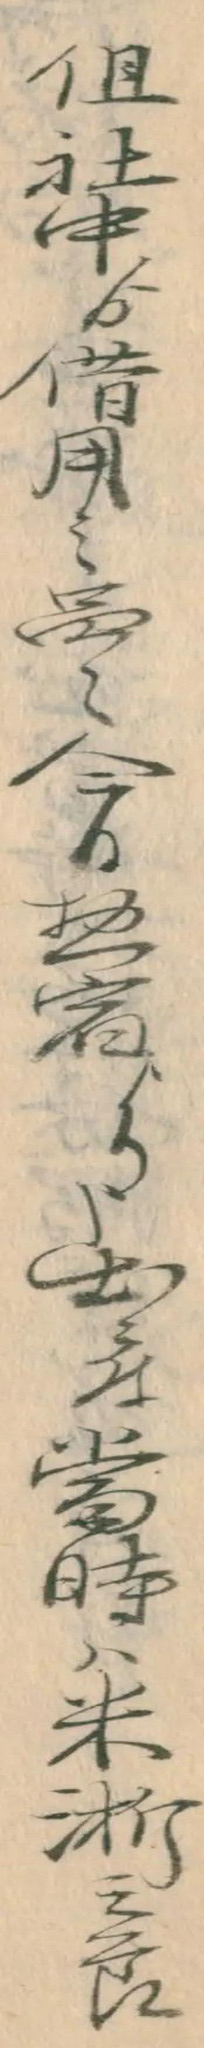但社中ゟ借用之品々今日惣宿より申出ニ付當時ハ米浙之節
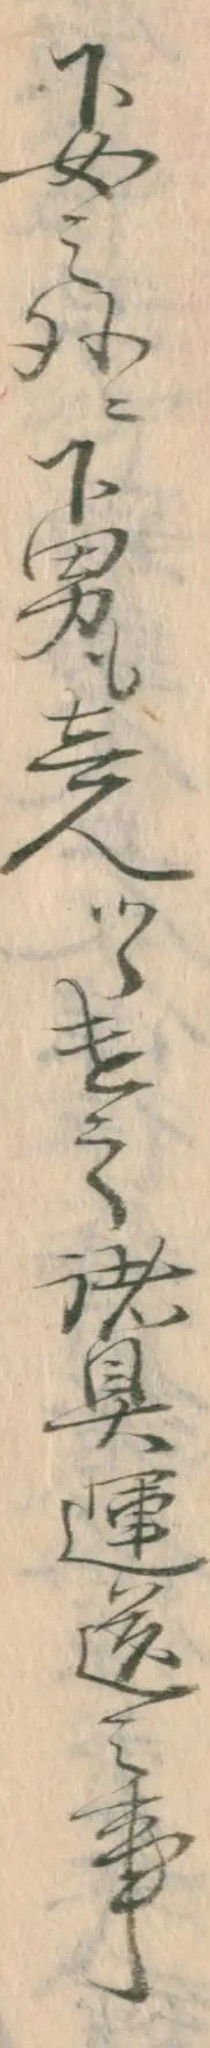下女之外ニ下男も壱人ツヽ遣之諸具運送之事
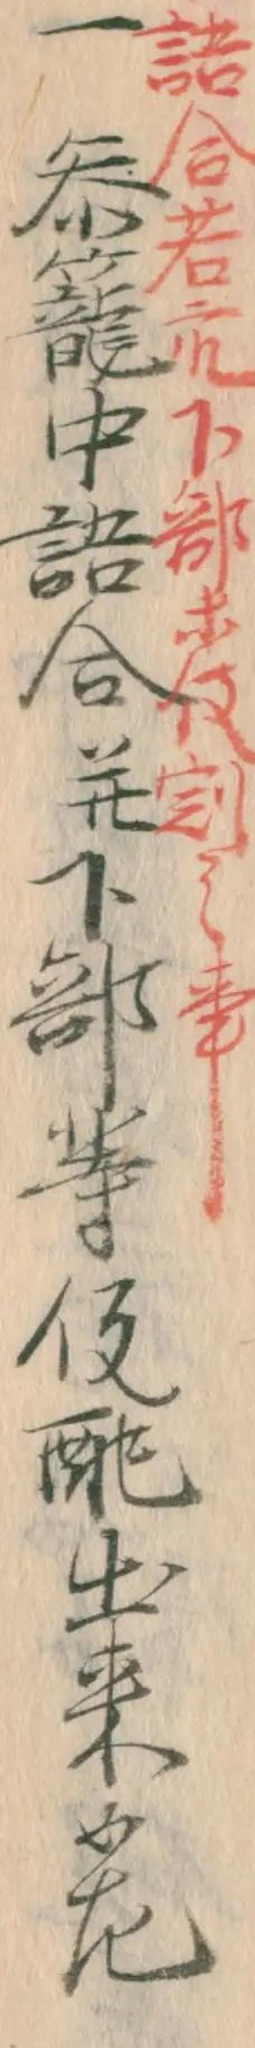一参籠中語合并下部等役配出来如左
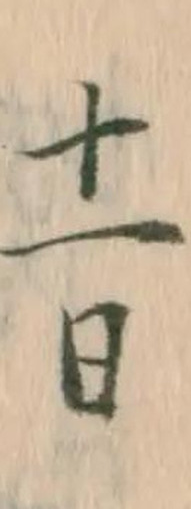十一日
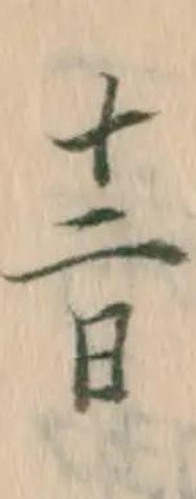十二日
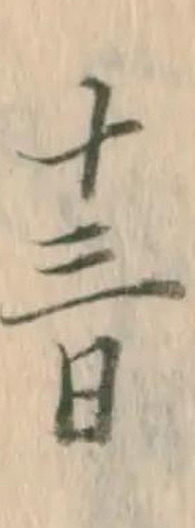十三日

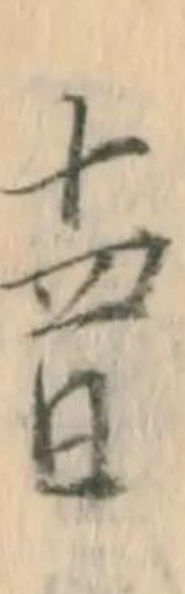十四日
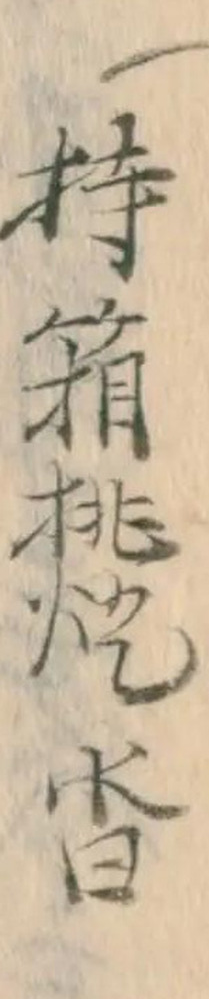持箱挑灯沓
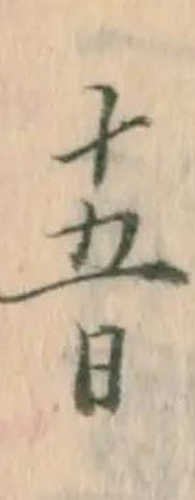十五日
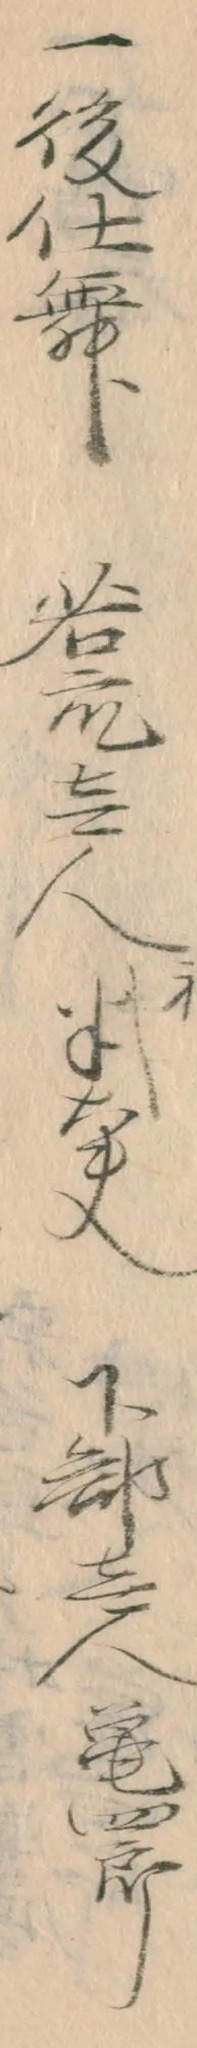一後仕舞若衆壱人袴半大夫下部壱人亀四郎
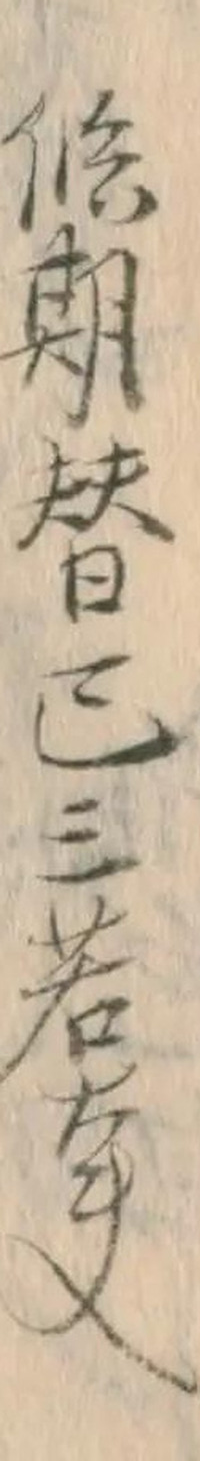後期替巳三若大夫
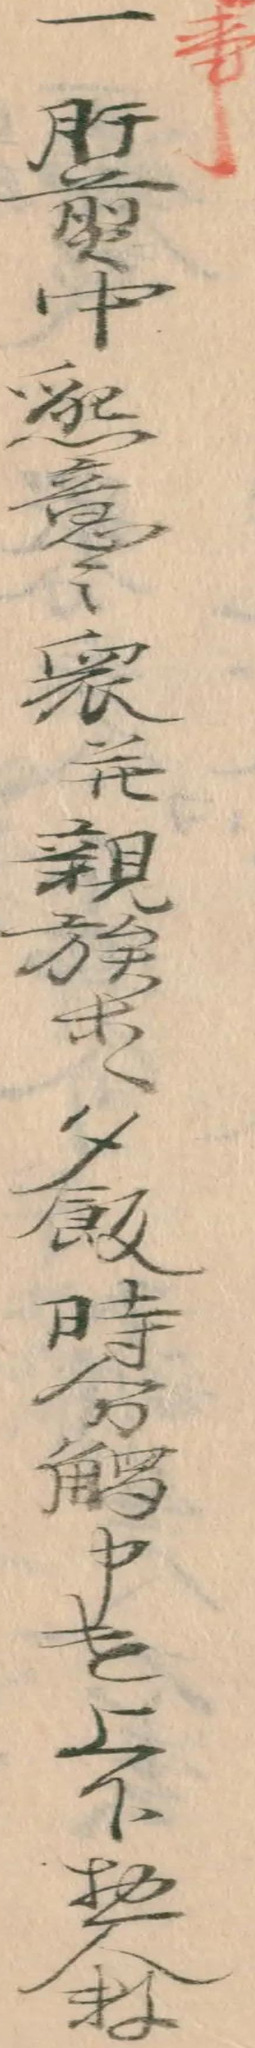一肝煎中懇意之衆并親族等へ夕飯時分觸申遣上下惣人数
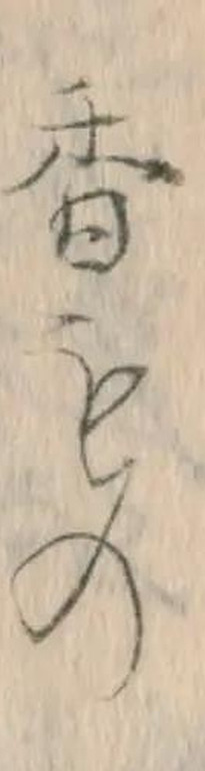香もの

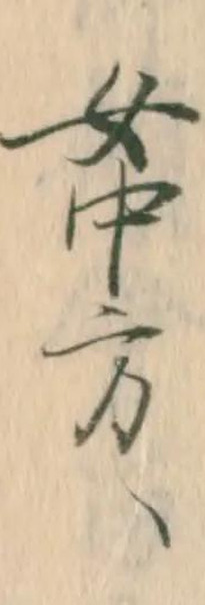女中方へ
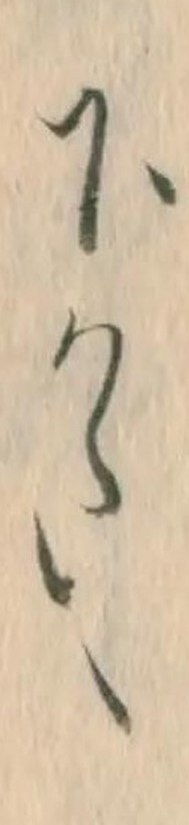下かたへ
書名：賀茂社記録. 第74冊
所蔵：国立国会図書館 National Diet Library, JAPAN
